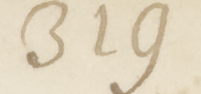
319
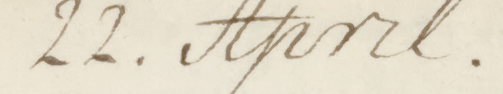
22. April.
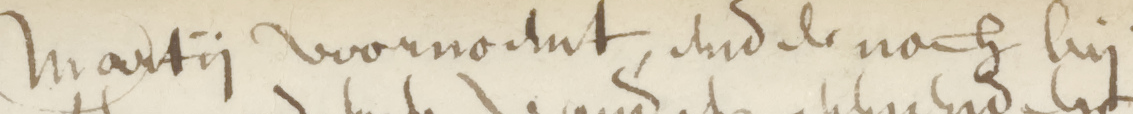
Martij voornoemt ende noch bij
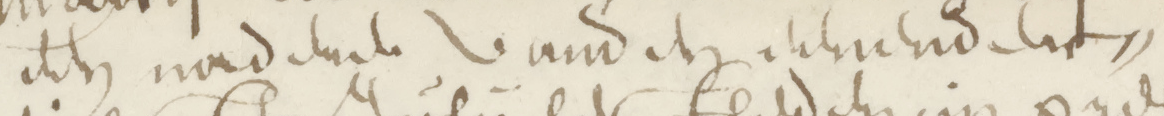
een nadere vanden eenender„
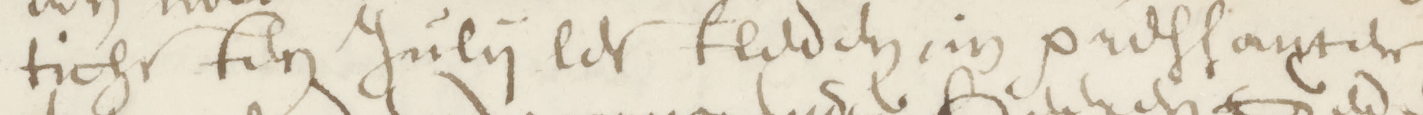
tichsten Julij lestleden, in pressanter
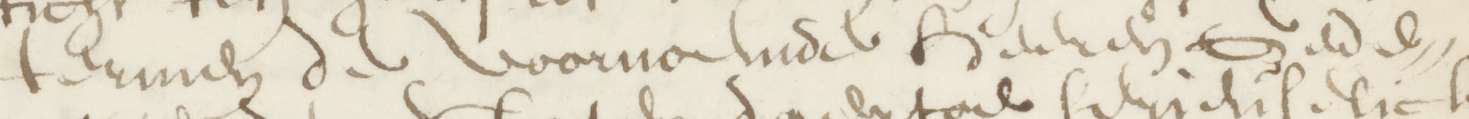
termen de voornoemde Heeren Gede,,
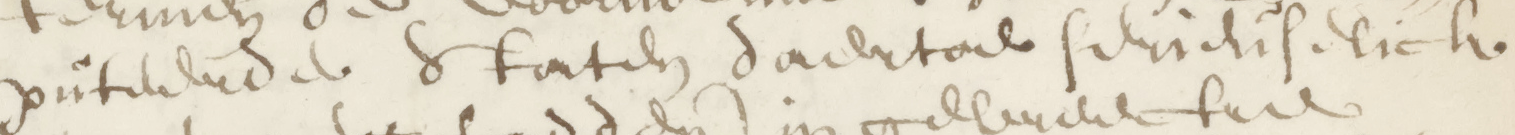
puteerde Staten daertoe serieuselick
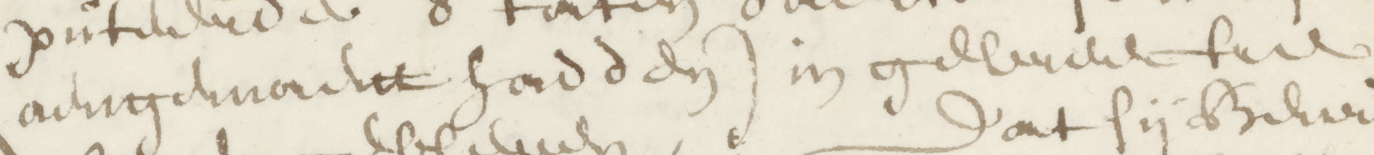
aengemaent hadden) in gebreecke
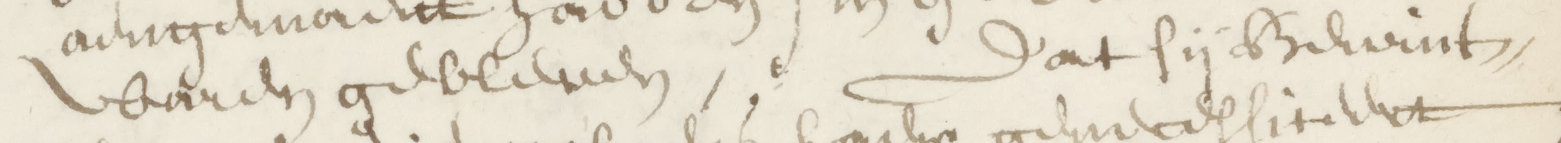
waren gebleven. Dat sij bewint,,
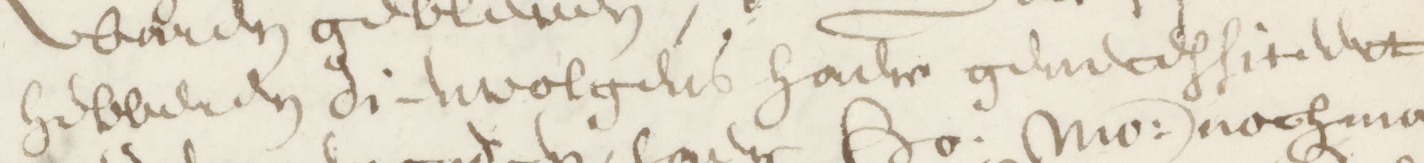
hebberen dienvolgens haer genecessiteert
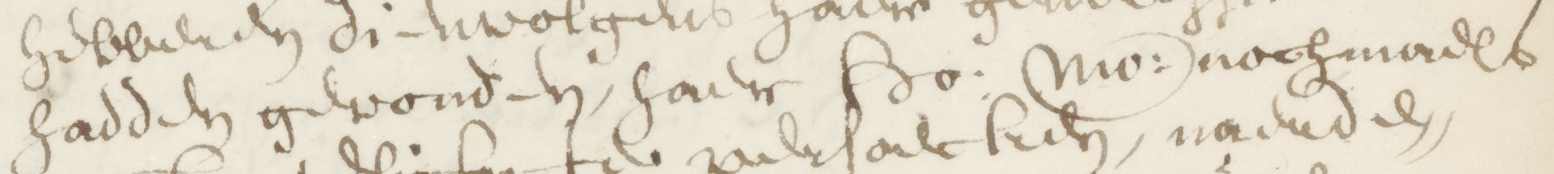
hadden gevonden, haer Ho:Mo: nochmaels
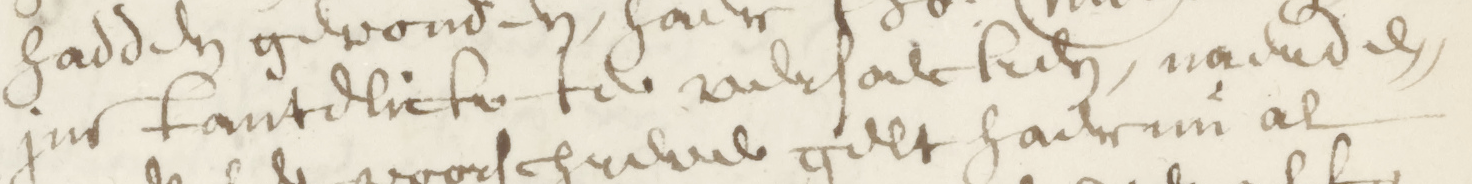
instantelick te versoecken, naerde„
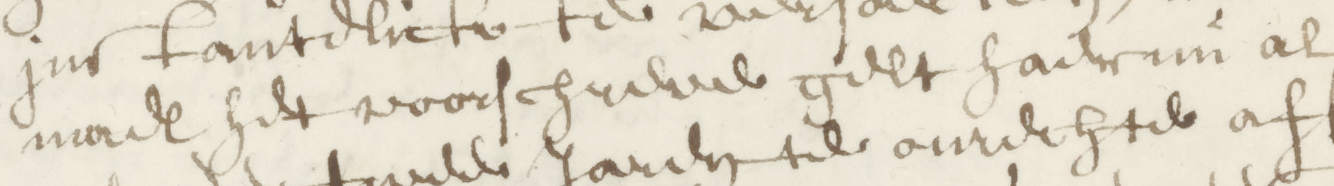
mael het voorschreve gelt haer nu al
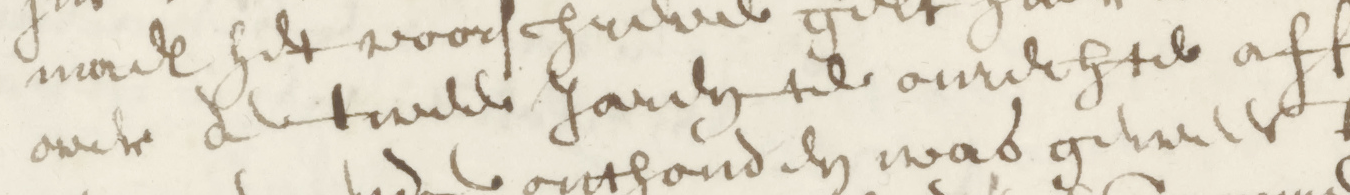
over de twee jaren te onrechte aff
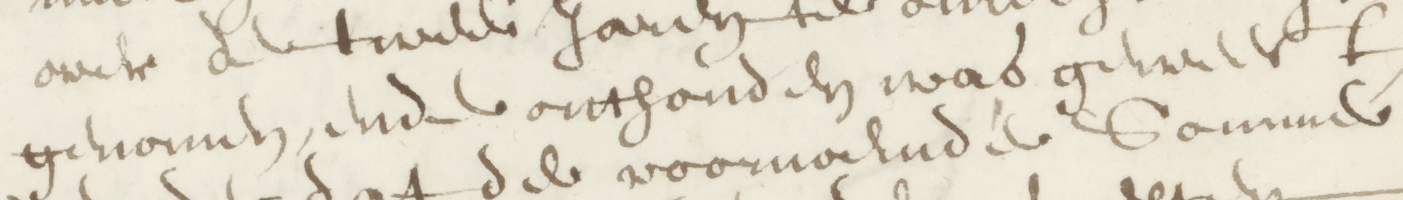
genomen, ende onthouden was geweest
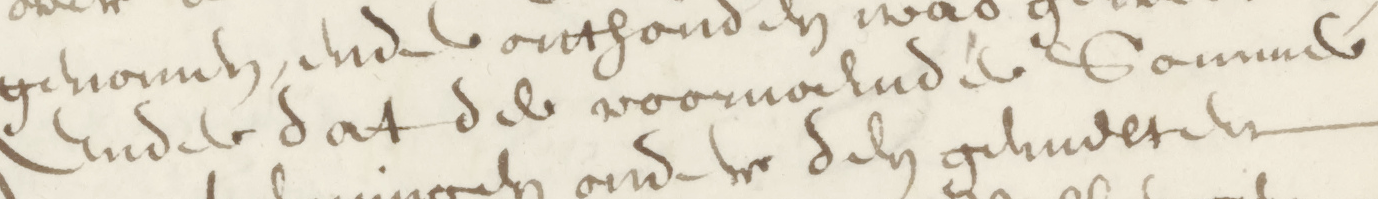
ende dat de voornoemde Somme
